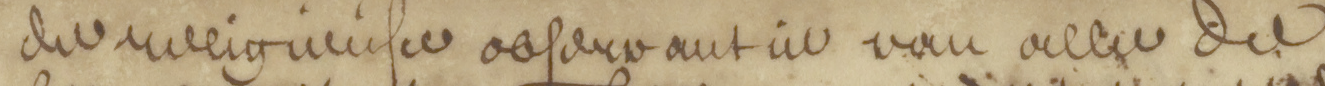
de religieuse observantie van alle de
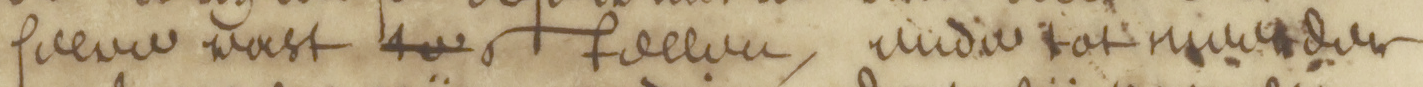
selve vast te stellen, ende tot meerder
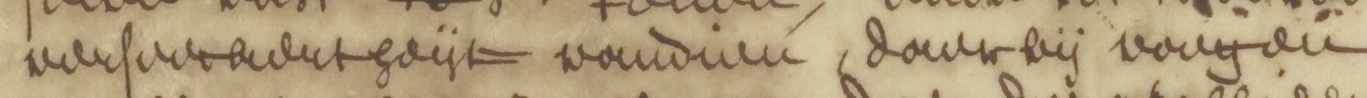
verseeckertheijt vandien, daerbij voegen
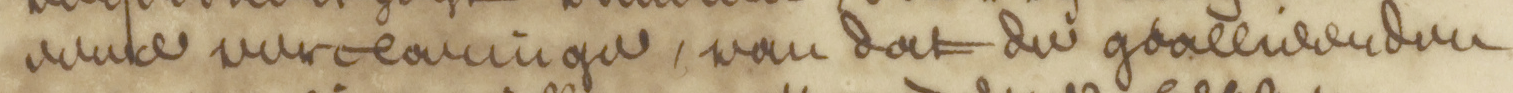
eene verclaringe, van dat de geallieerden
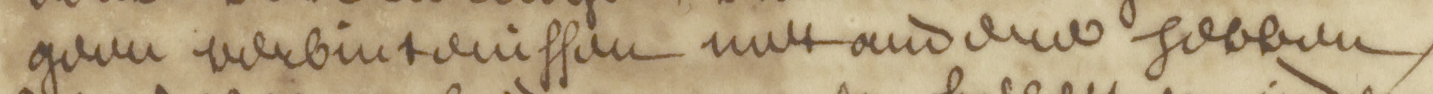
geen verbintenissen met andere hebben
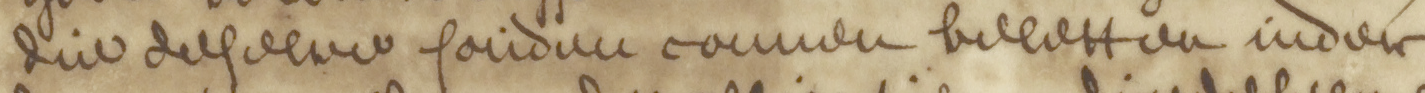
die deselve souden connen beletten inder
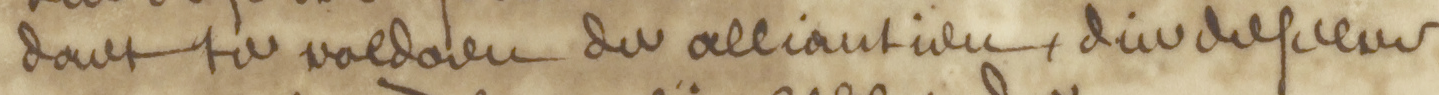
daet te voldoen de alliantien, die deselve
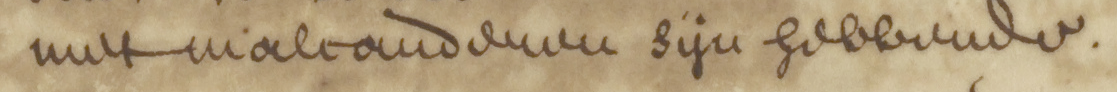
niet malcanderen sijn hebbende.
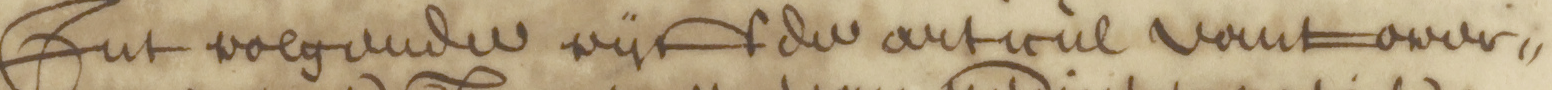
Int volgende vijffde articul vant over„
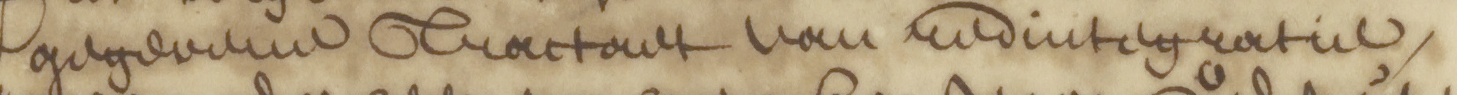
,,gegevene Tractaet van redintegratie,
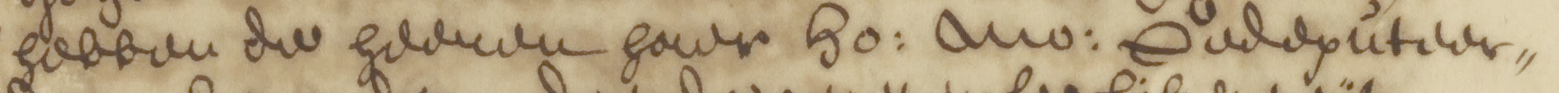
hebben de heeren haer Ho:Mo: Gedeputeer,
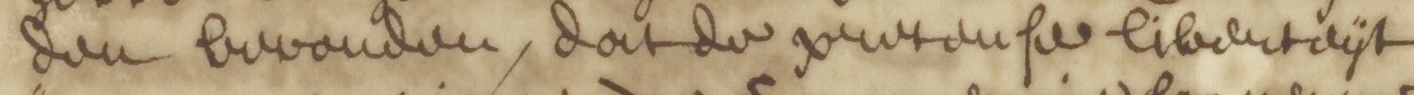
den bevonden, dat de pretense liberteijt
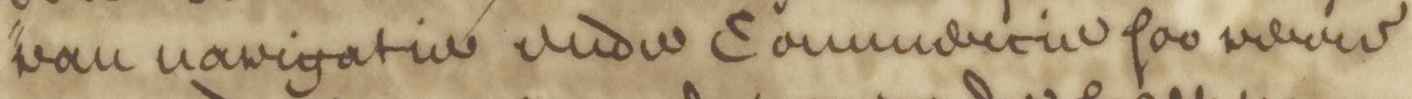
van navigatie ende Commercie soo verre
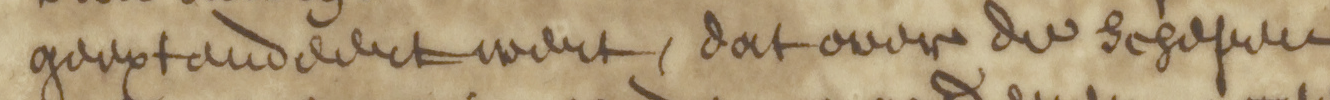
geextendeert wert, dat over de schepen
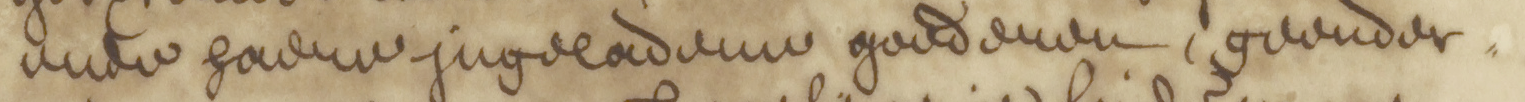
ende haere ingeladene goederen, geender,,
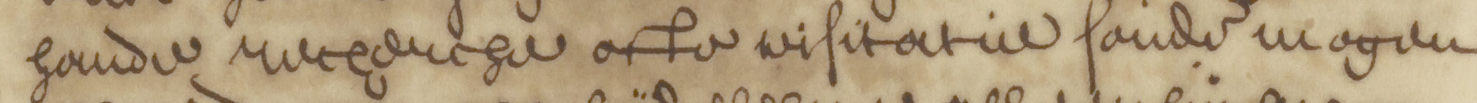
hande recherche ofte visitatie soude mogen
